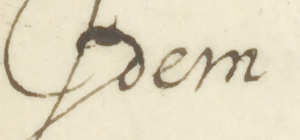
Idem
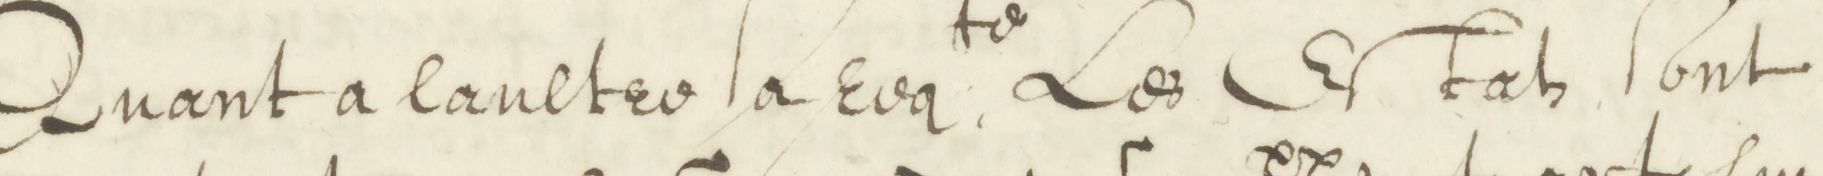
Quant a laultre la reqte les Estatz sont
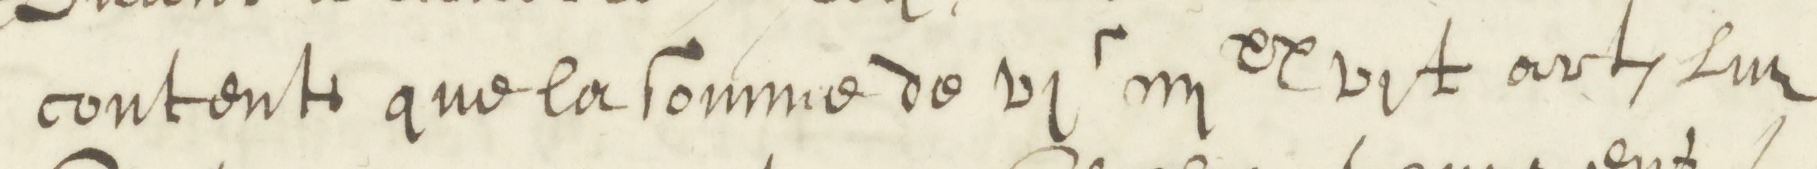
content que la somme de vic iiiixx vi l. arth lui
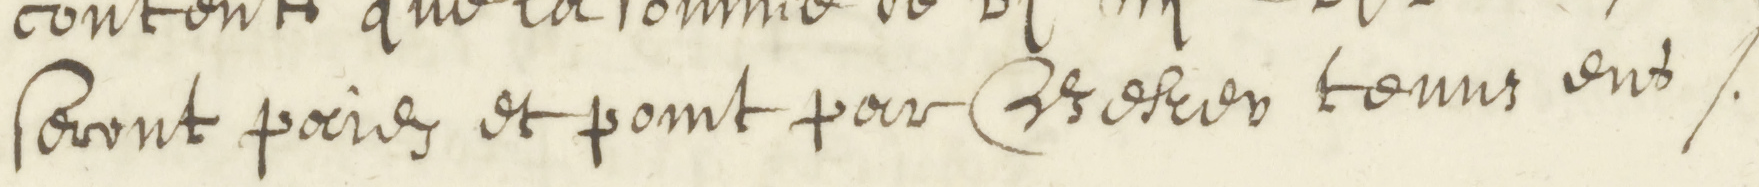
seront paiez et point par Beken tenuz eus.
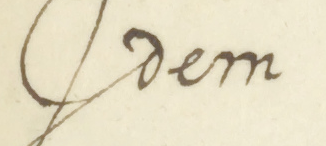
Idem
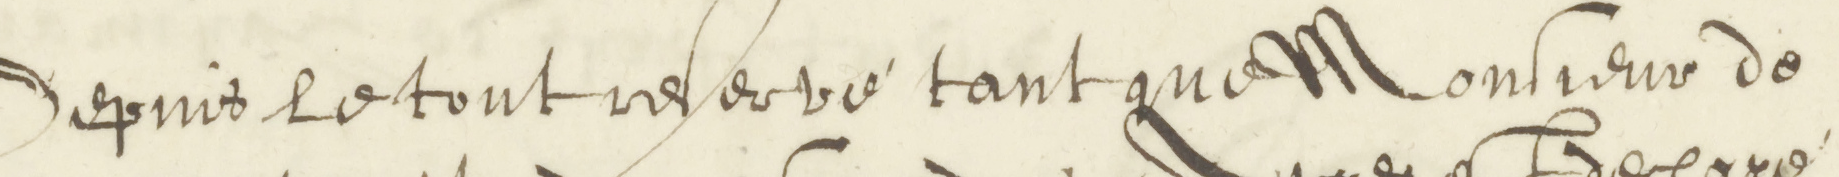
Depuis le tout reserve tant que Monsieur de
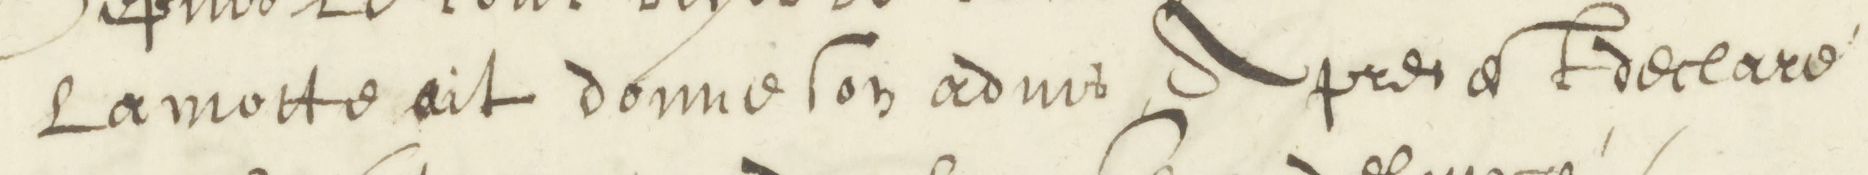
Lamotte ait donne son advis apres est declaré
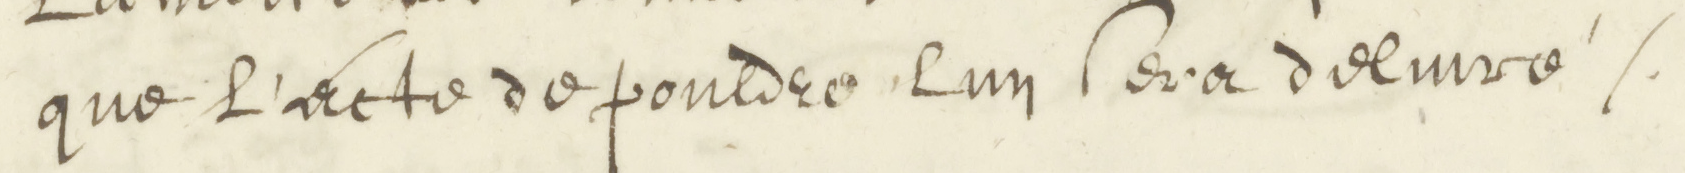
que L'acte de pouldre luy sera delivré.
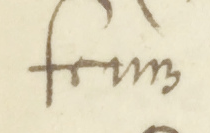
fcum
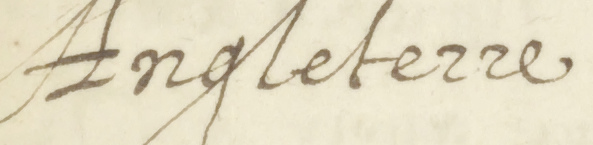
Angleterre
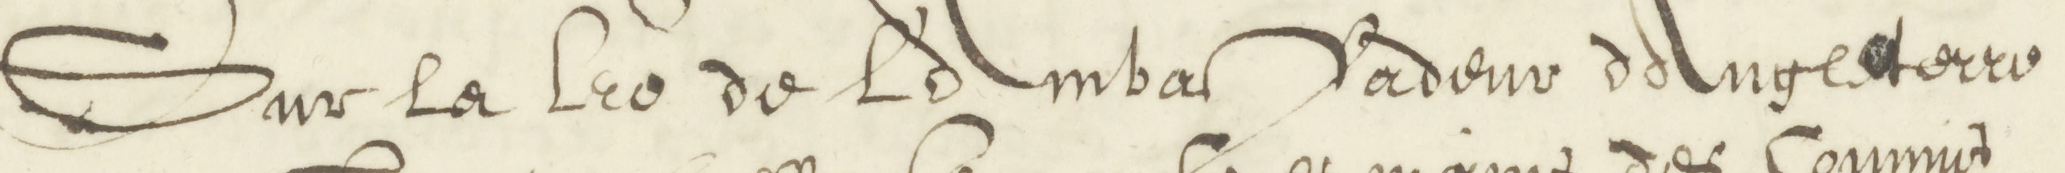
Sur la Lre de l'Ambassadeur dAngleterre
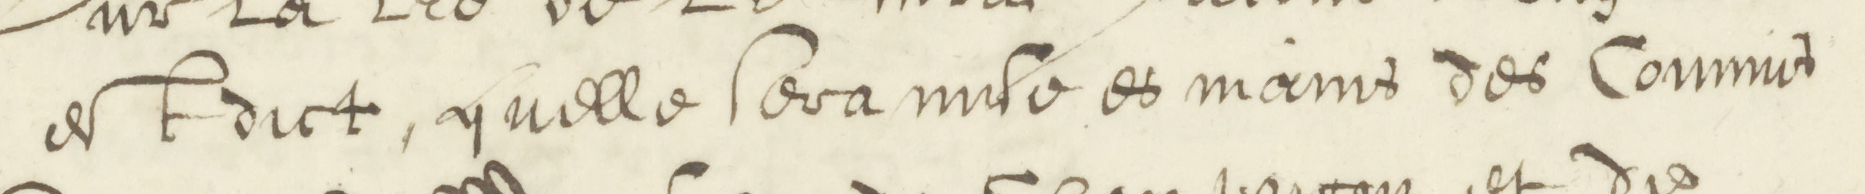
est dict, quelle sera mise es mains des commis
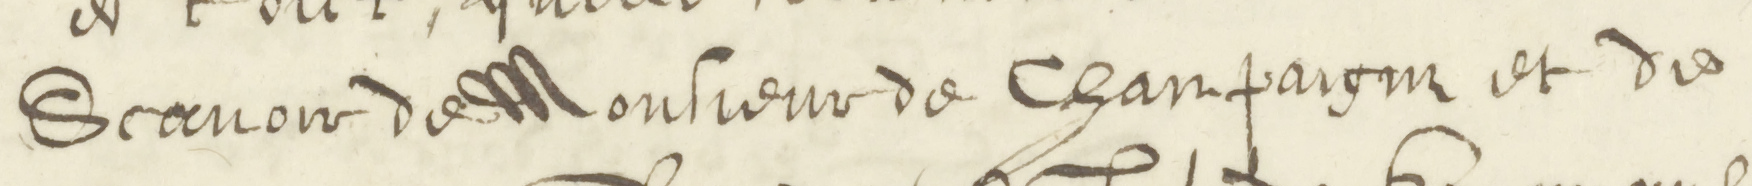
scavoir de Monsieur de Champaigny et de
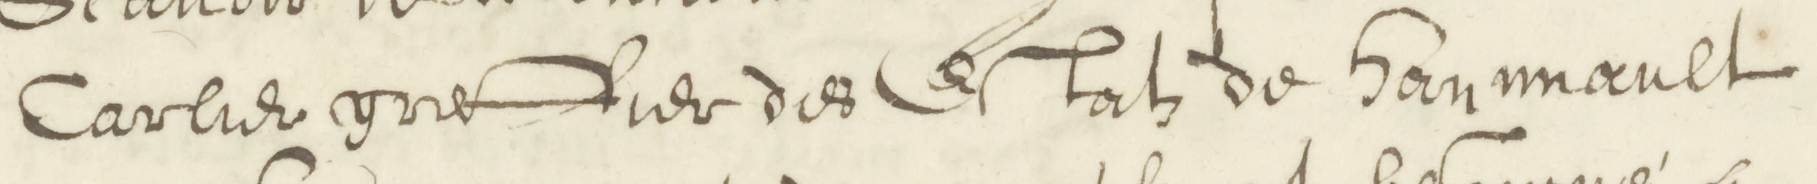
Carlier greffier des Estatz de Haynnault
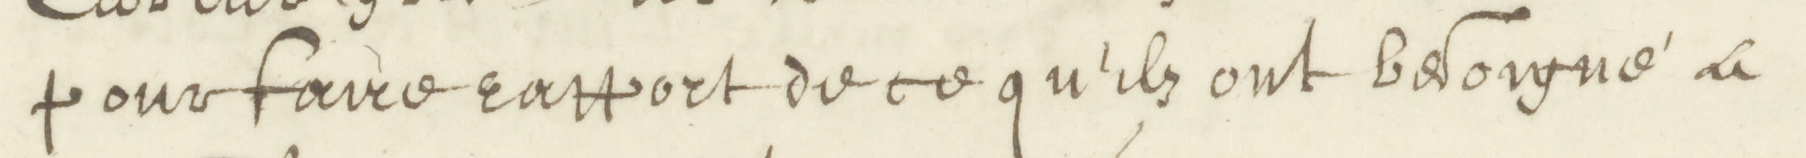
pour faire rapport de ce qu'ils ont besoigné a
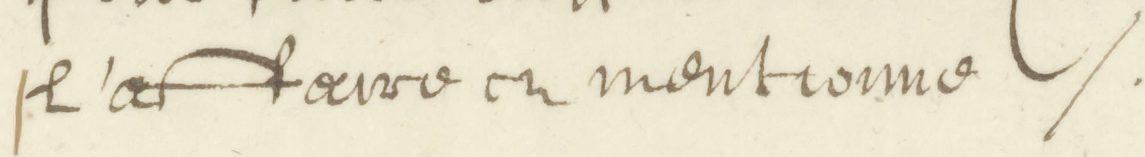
l'affaire cy mentionne.
